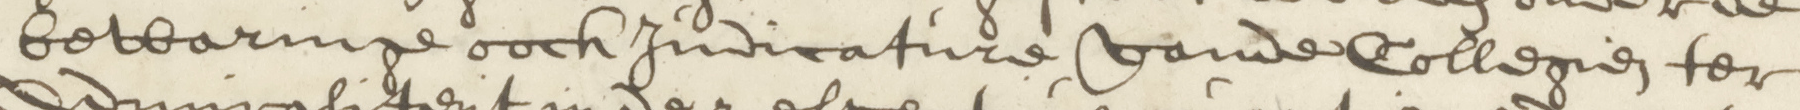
bewaringe oock Judicature vande Collegien ter
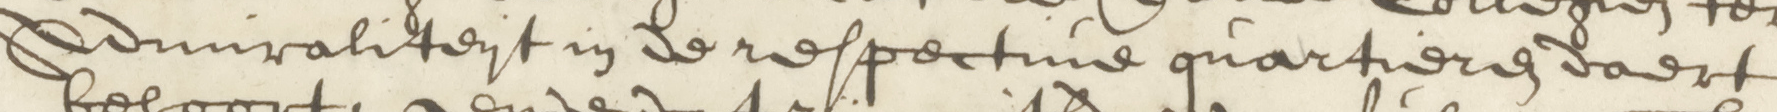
Admiraliteijt in de respective quartieren daert
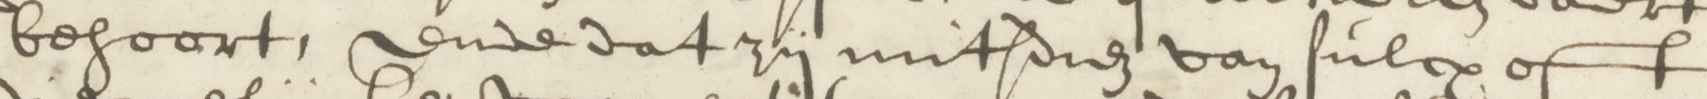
behoort, ende dat zij mitsdien van sulcx oft
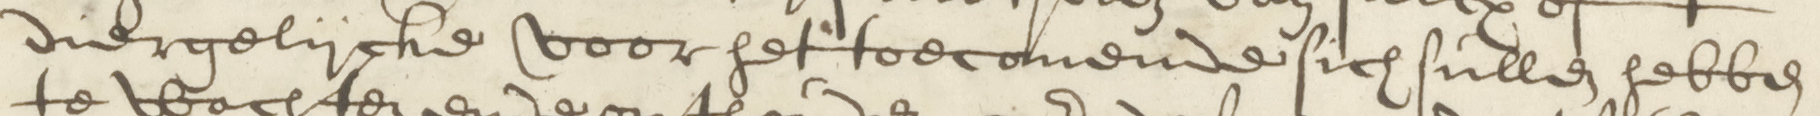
diergelijcke voor het toecomende sich sullen hebben
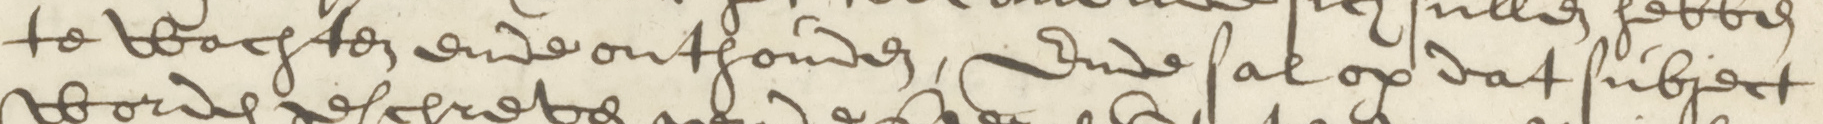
te wachten ende onthouden. Ende sal op dat subject
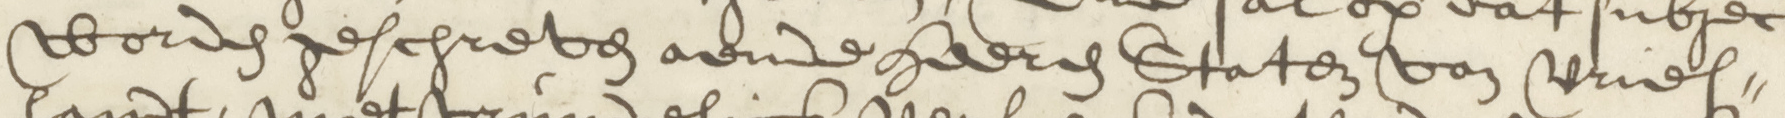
worden geschreven aende heeren Staten van Vries„
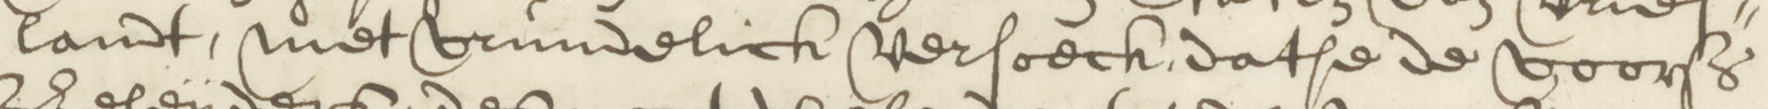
landt, met vrundelick versoeck datse de voorsz
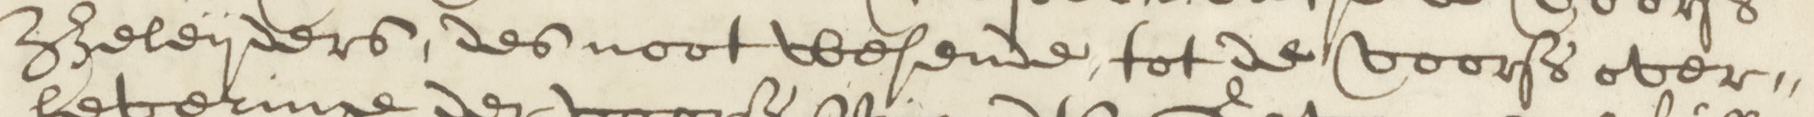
Beleijders, des noot wesende tot de voorsz over„
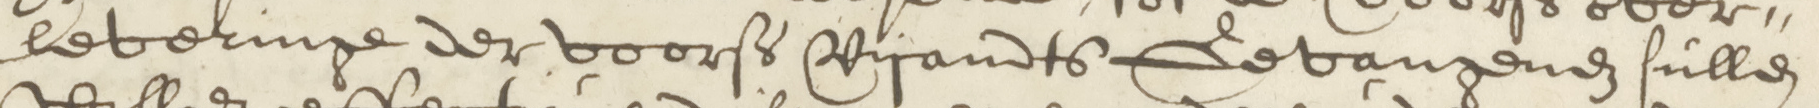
leveringe der voorsz vijandts Gevangenen sullen
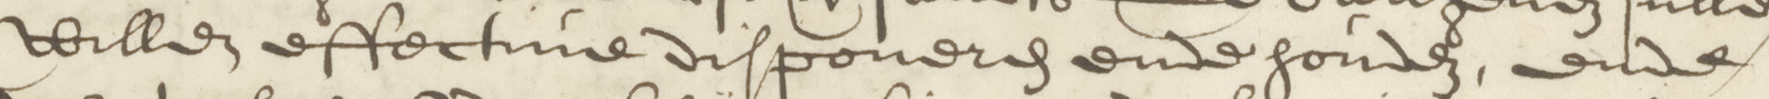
willen effectiue disponeren ende houden, ende
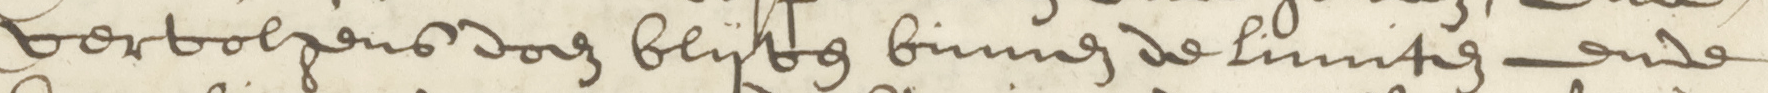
vervolgens doen blijven binnen de limiten ende
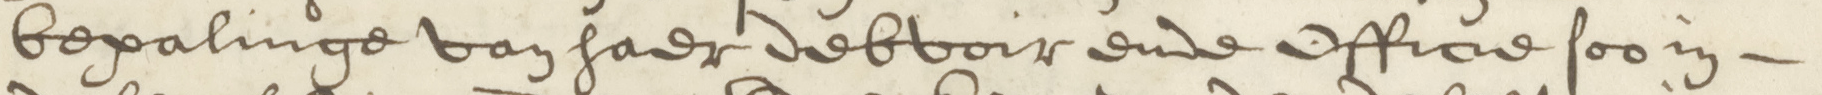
bepalinge van haer debvoir ende officie soo in —
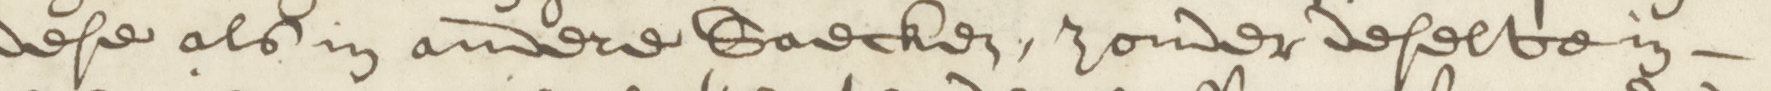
dese als in andere Saecken, zonder deselve in —
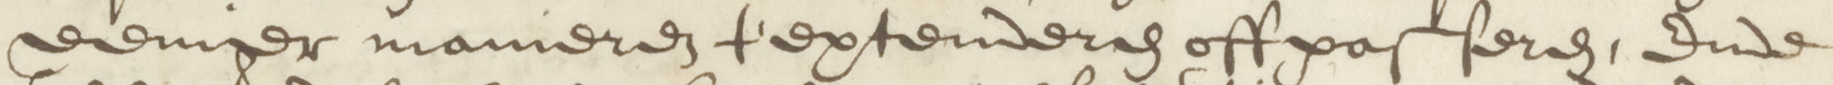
eeniger manieren t'extenderen off passeren. Ende
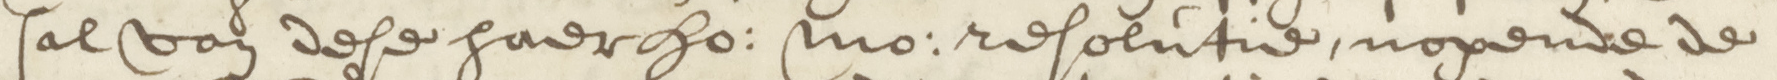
sal van dese haer Ho:Mo: resolutie, nopende de
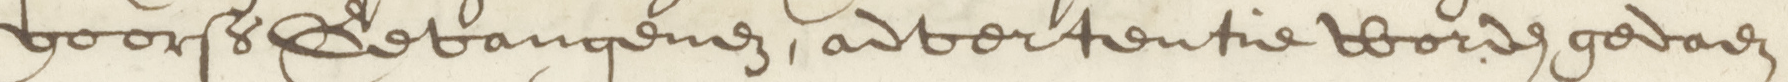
voorsz Gevangenen, advertentie worden gedaen
